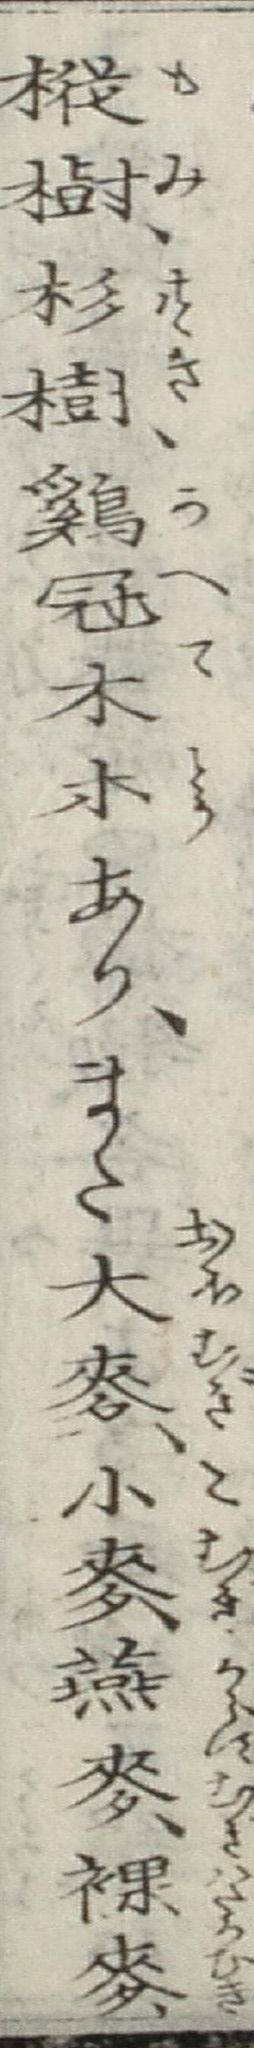樅樹、杉樹、鶏冠木等あり、また大麦、小麦、燕麦、裸麦
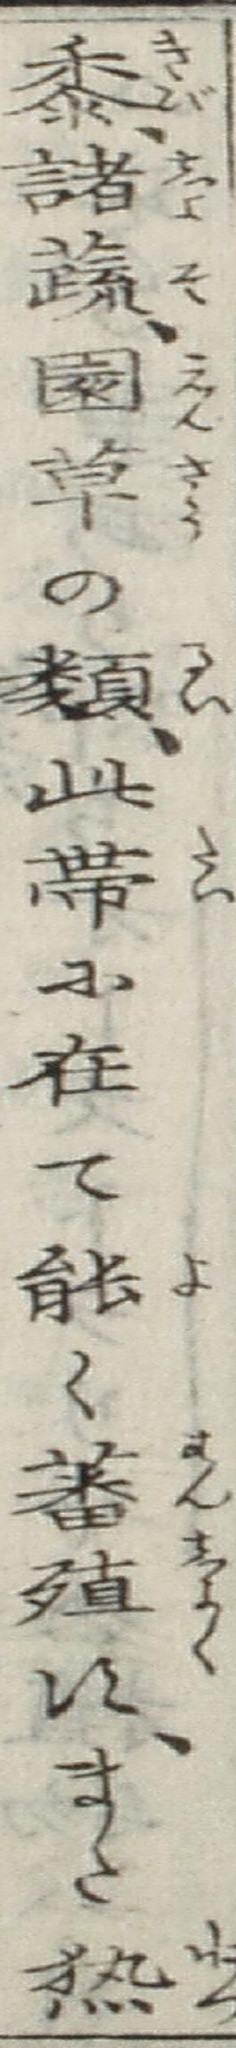黍、諸蔬、園草の類、此帯に在て能く蕃殖す、また熱
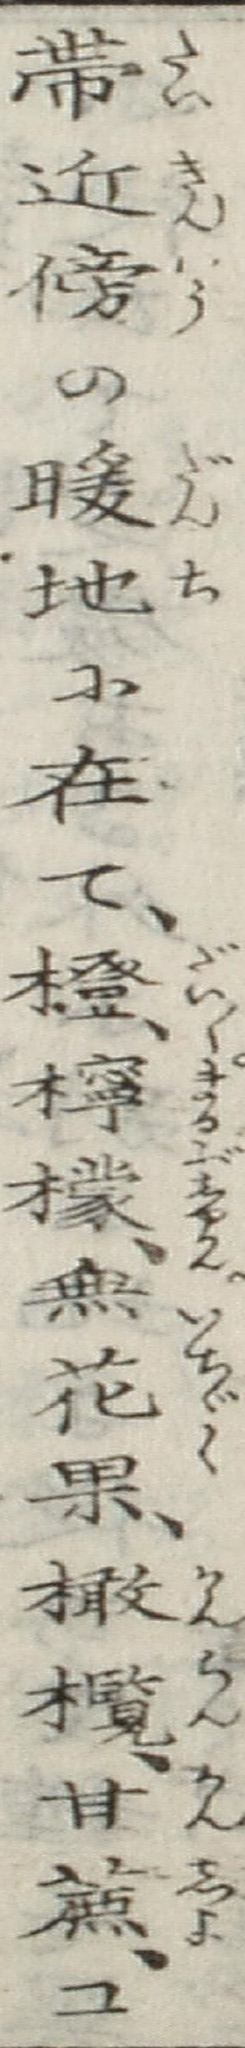帯近傍の暖地に在て、橙、檸檬、無花果、橄欖、甘蔗、ユ
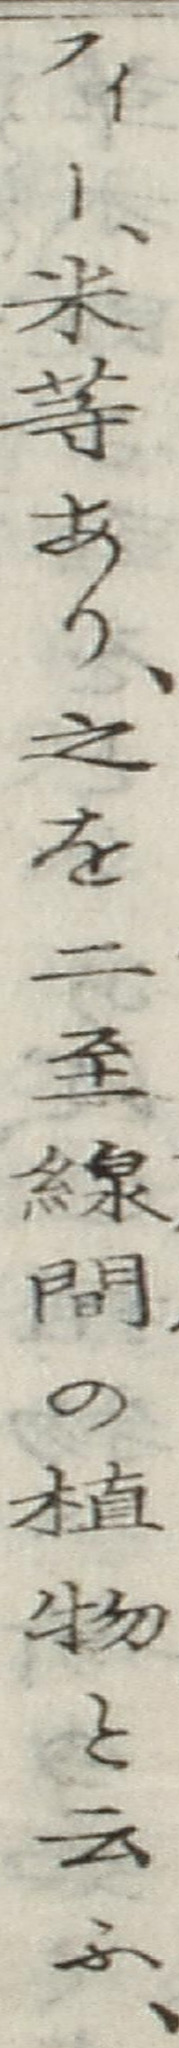フィー、米等あり、之を二至線間の植物と云ふ、
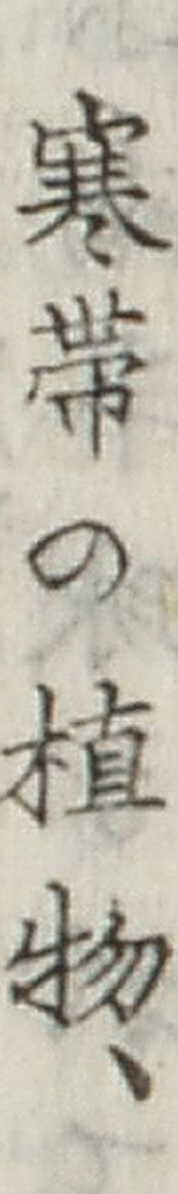寒帯の植物、
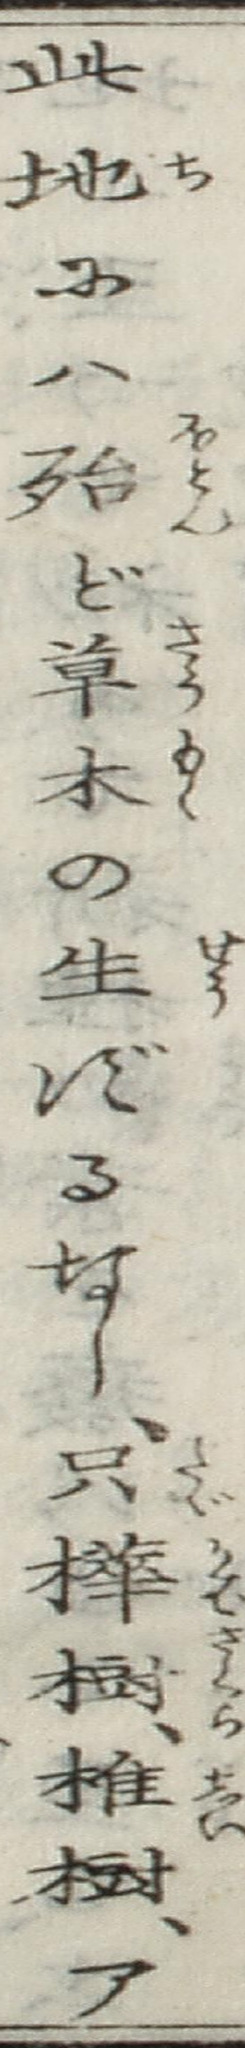此地には殆ど草木の生ずるなし、只樺樹、椎樹、ア
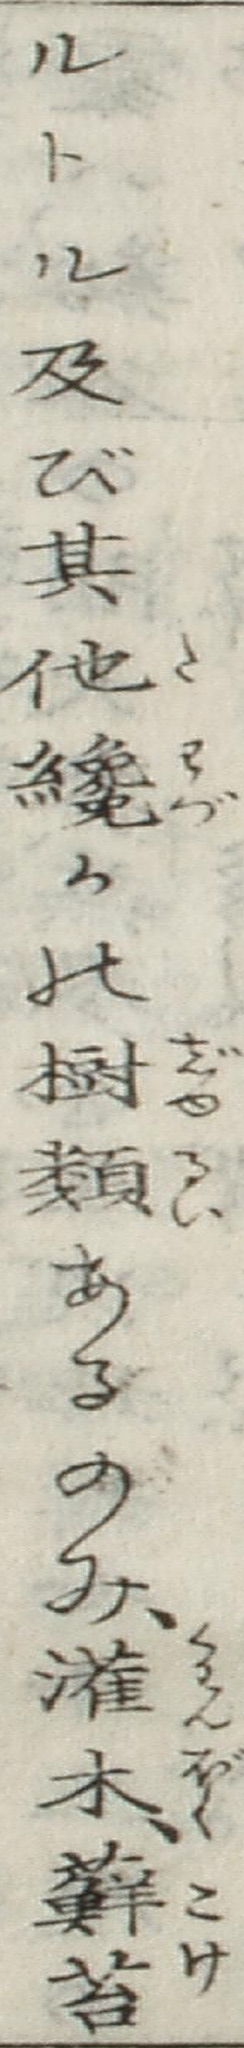ルトル及び其他僅かの樹類あるのみ、灌木、蘚苔
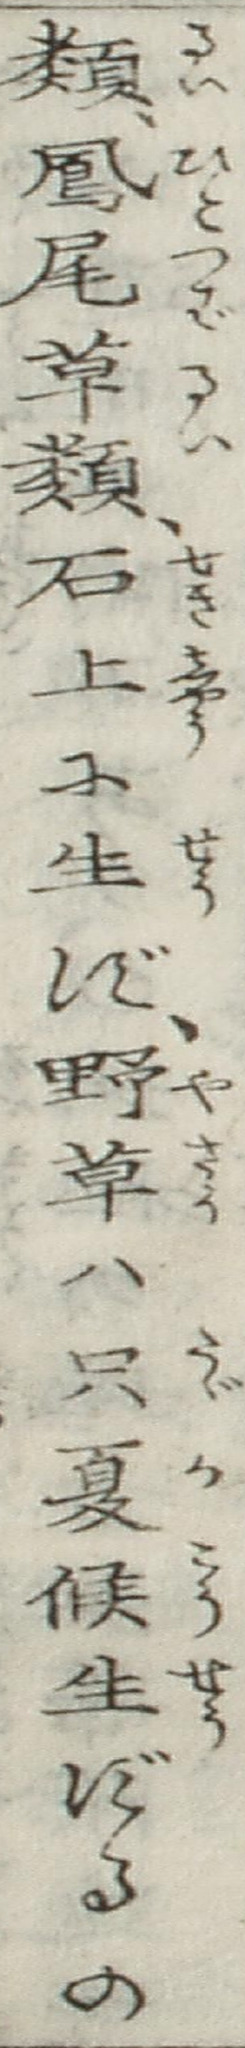類、鳳尾草類、石上に生ず、野草は只夏候生ずるの
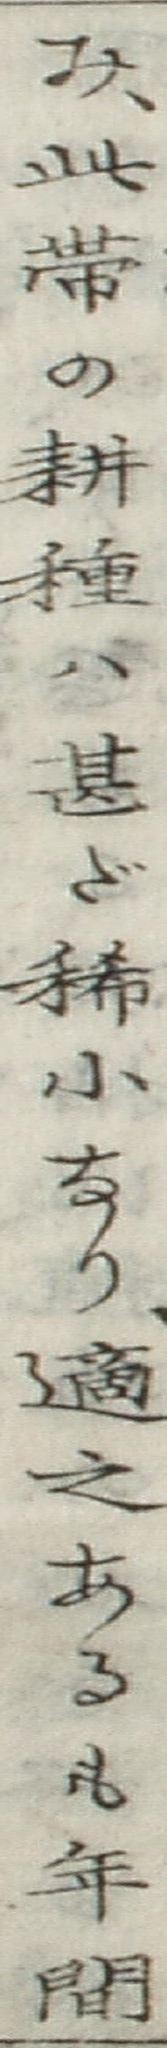み、此帯の耕種は甚だ希少なり、適之あるも年間
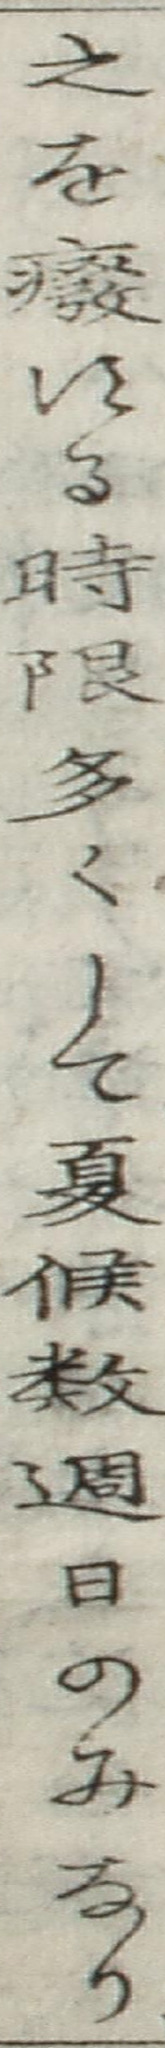之を廃する時限多くして、夏候数週日のみなり、

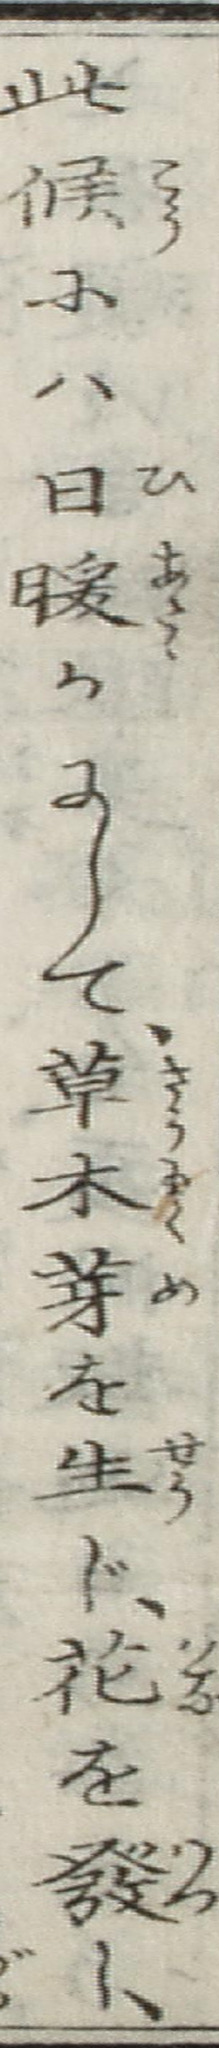此候には日暖かにして、草木芽を生じ、花を発し、
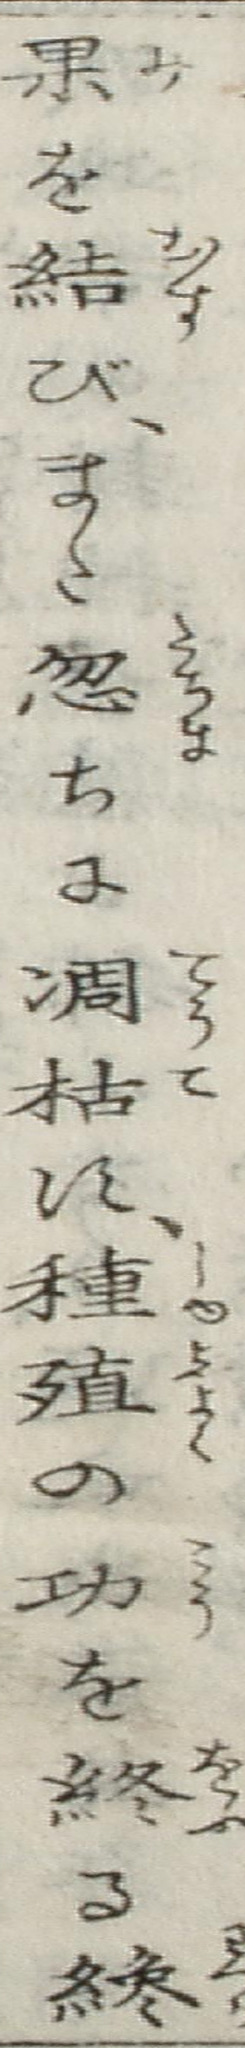果を結び、また忽ちに凋枯す、種殖の功を終る僅
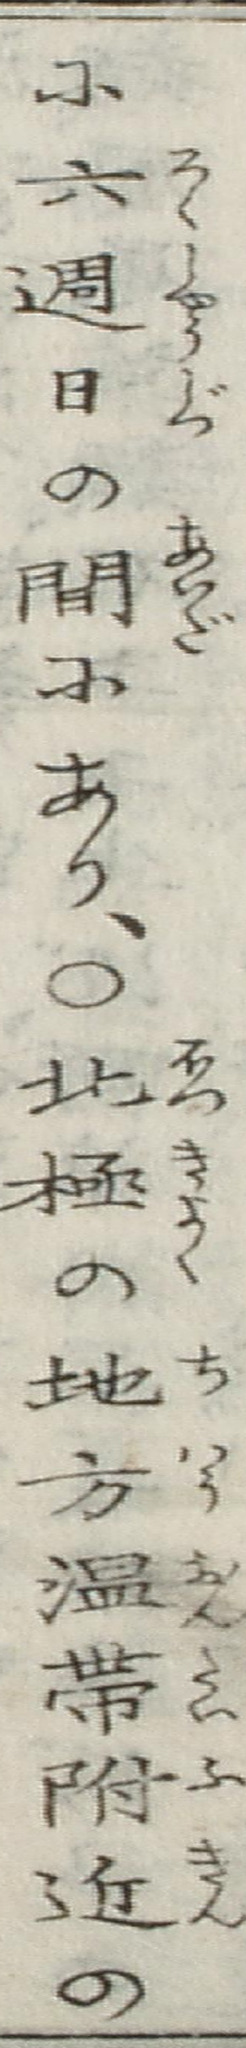に六週日の間にあり、〇北極の地方温帯付近の
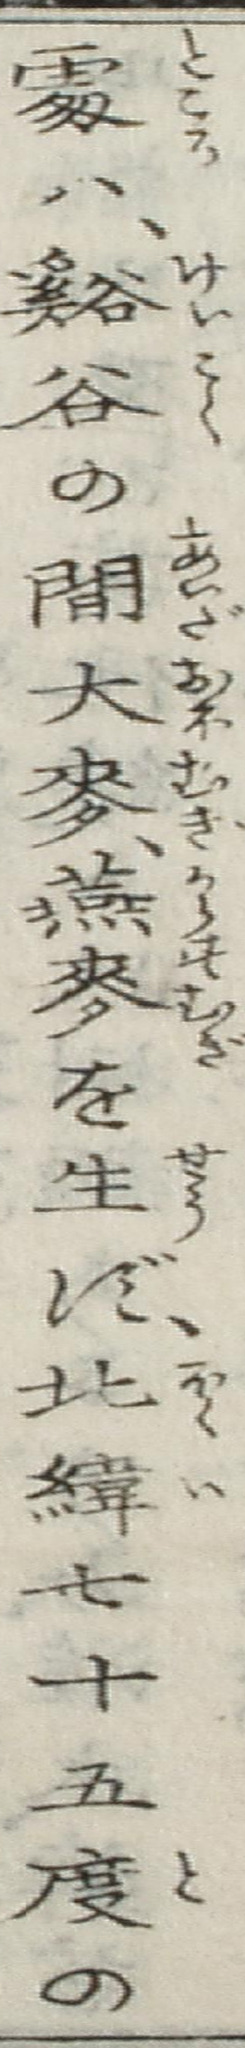処は、渓谷の間大麦、燕麦を生ず、北緯七十五度の
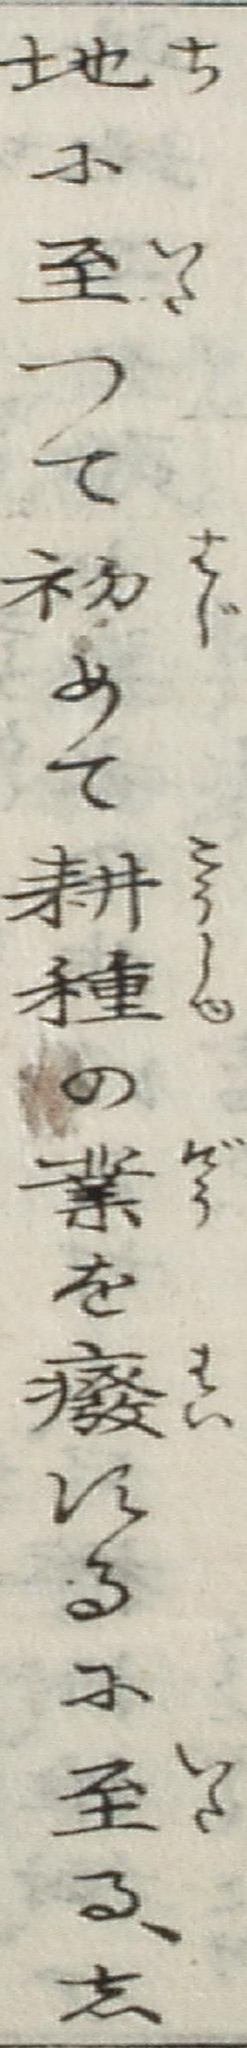地に至つて初めて耕種の業を廃するに至る、し
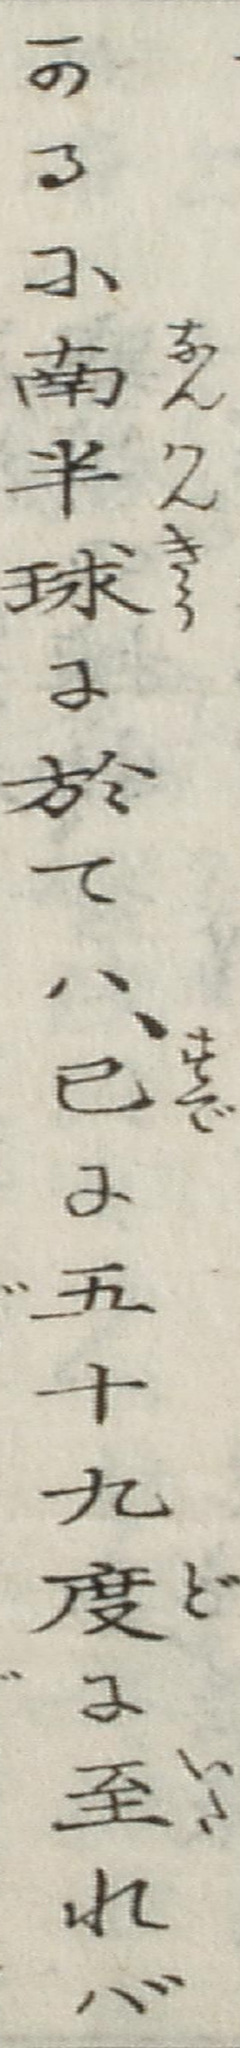かるに南半球に於ては、已に五十九度に至れば
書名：訓蒙　天然地理學　下
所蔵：東京大学地震研究所図書室 Earthquake Research Institute Library, The University of Tokyo, JAPAN
